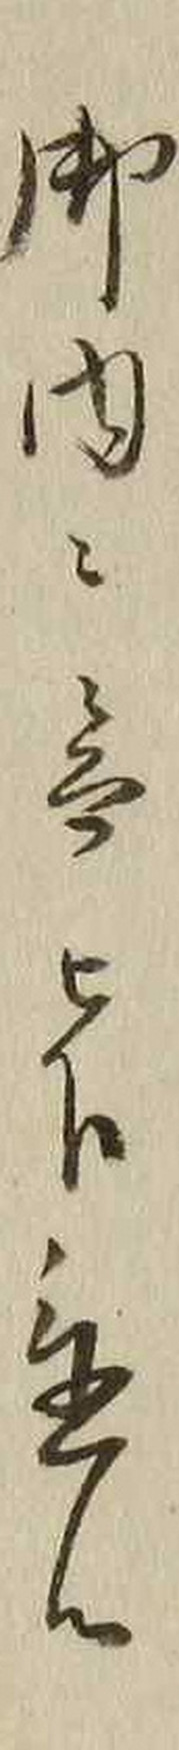御内々ニ而被下置候
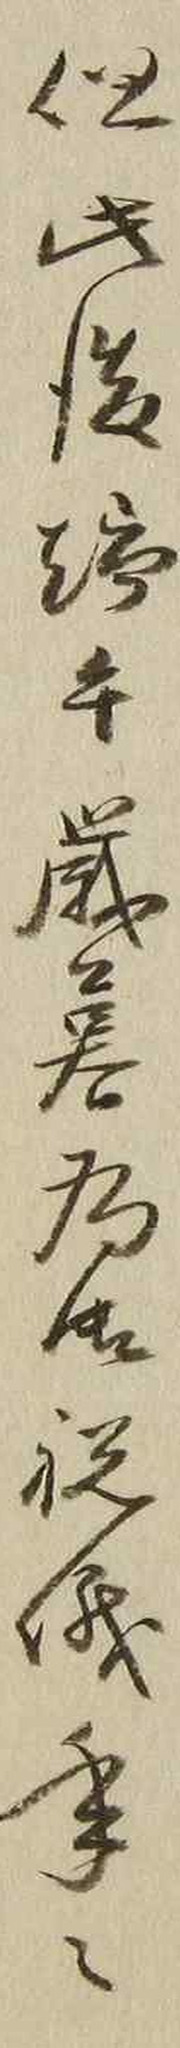但此後端午歳暮為御祝儀年々
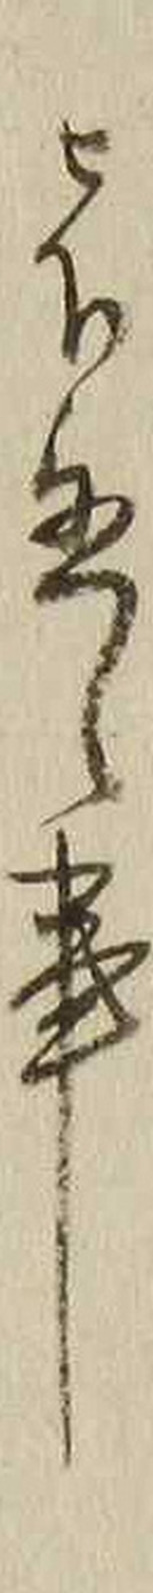被下置候事
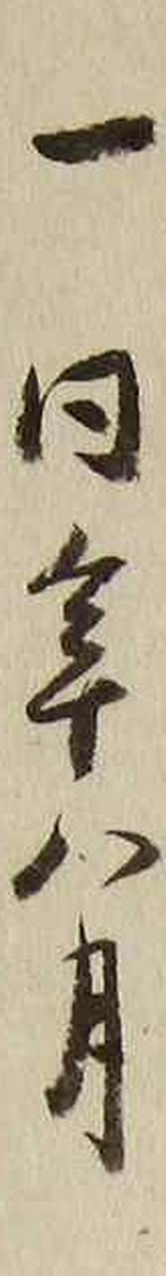一同年八月
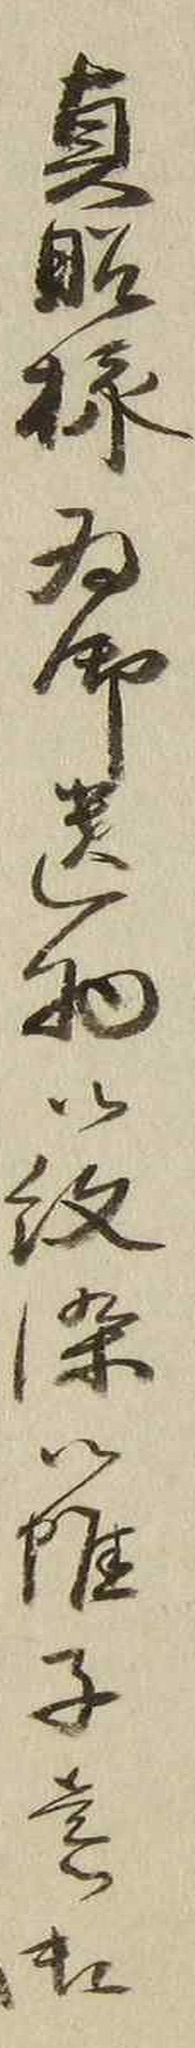真昭様為御遺物御紋染御帷子壱ツ御
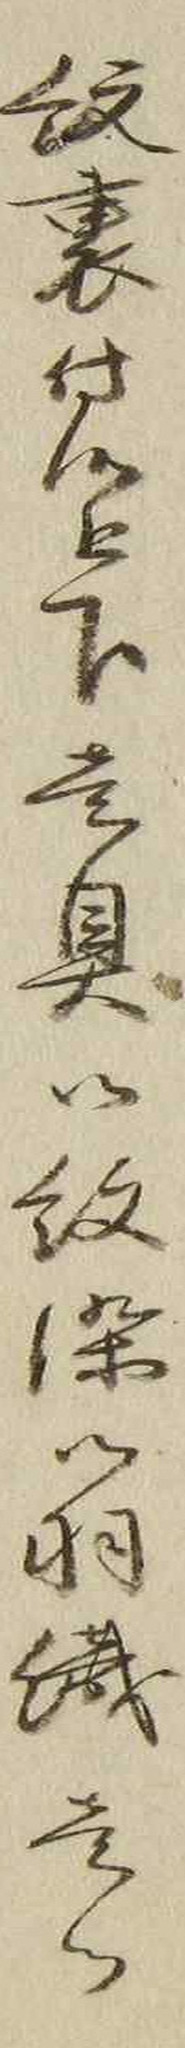紋裏付御上下壱具御紋染御羽織壱ツ
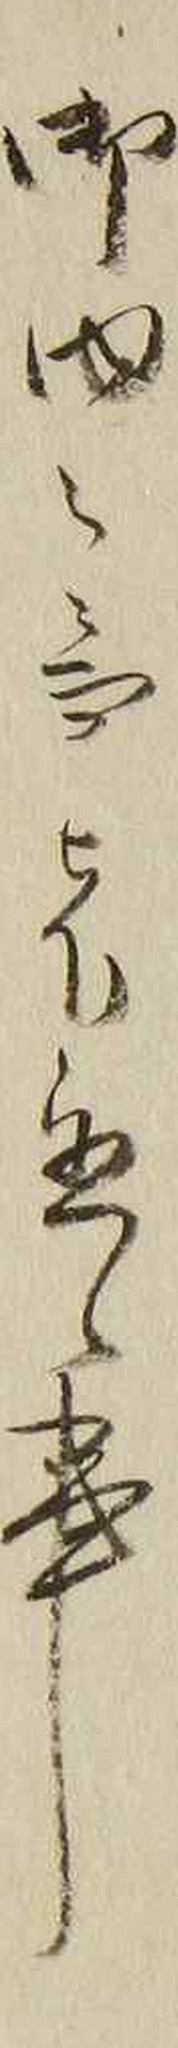御内々ニ而被下置候事
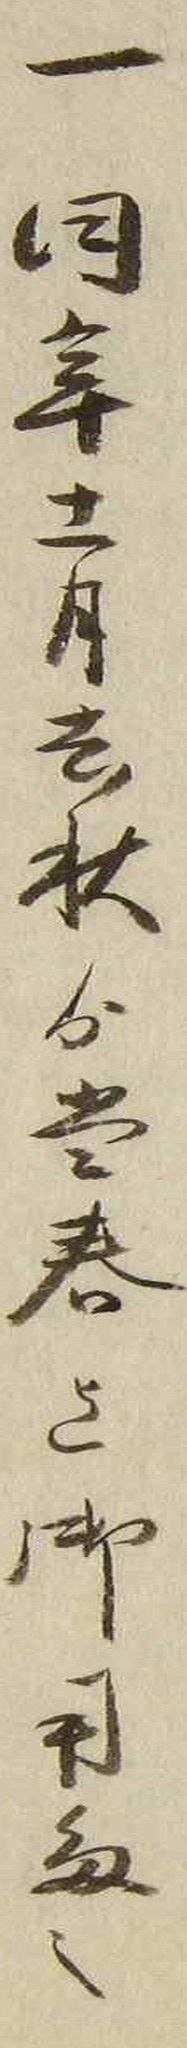一同年十一月去秋ゟ当春迄御用多之
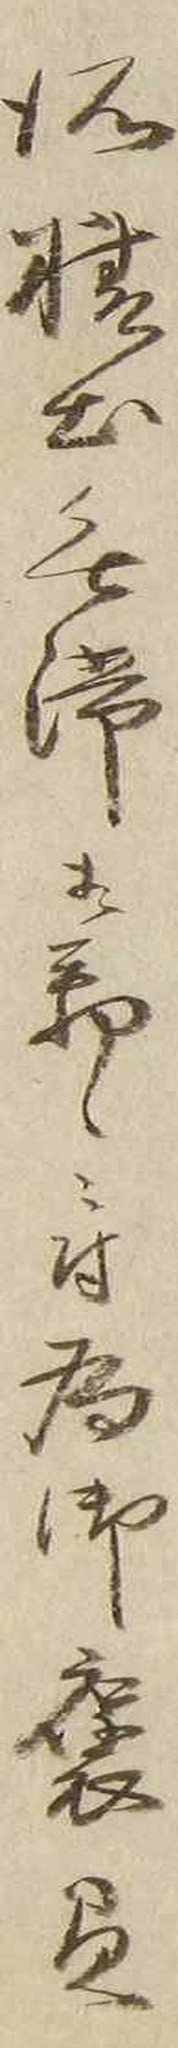所精出無滞相勤候ニ付為御褒美
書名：諸士系譜　巻之261　あ之部14
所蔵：会津若松市立会津図書館
